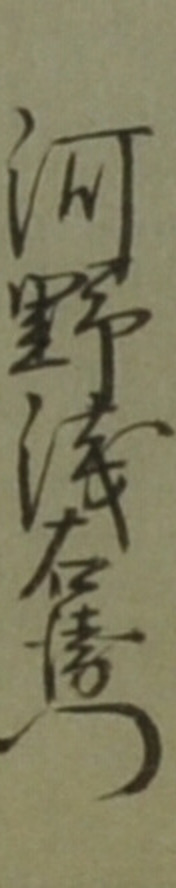河野儀右衛門
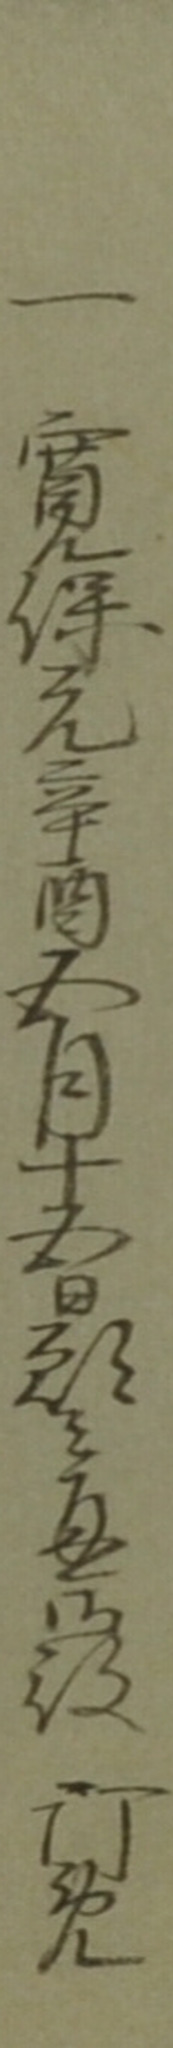一寛保元辛酉五月十五日願之通御役御免
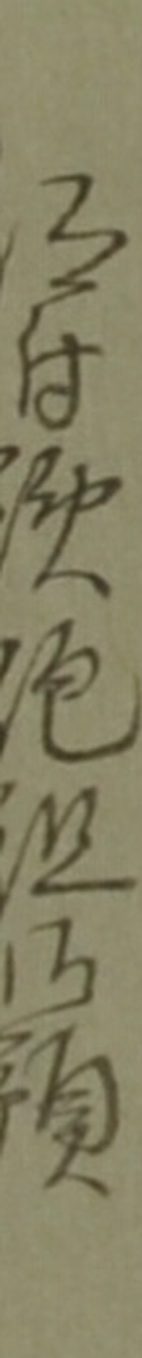仰付鉄砲組御預
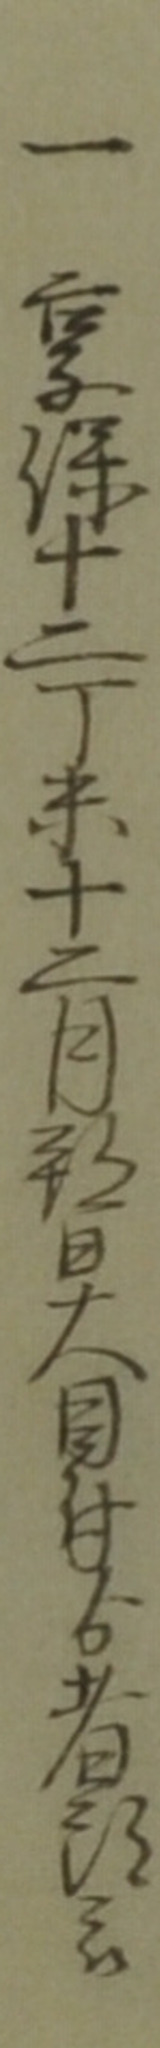一享保十二丁未十二月朔日大目付ゟ者頭被
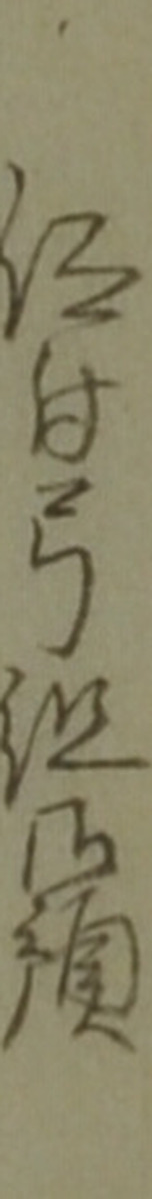仰付弓組御預
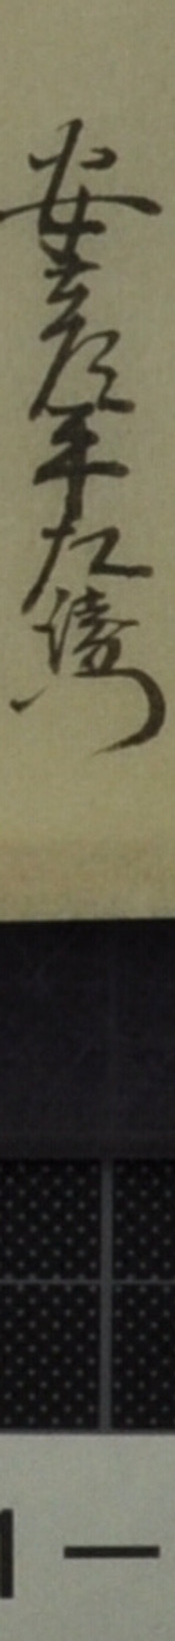安彦平左衛門
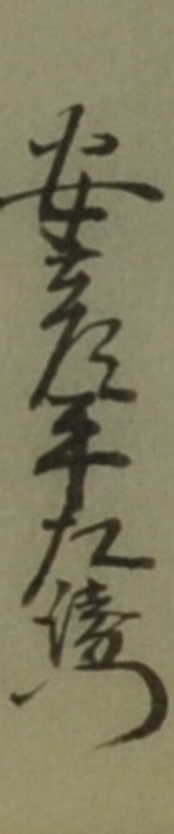安彦平左衛門
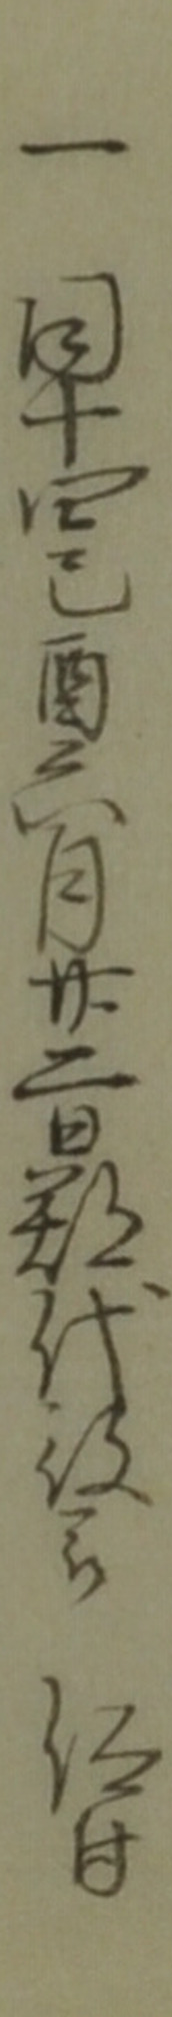一同十四己酉六月廿二日郡代役被仰付
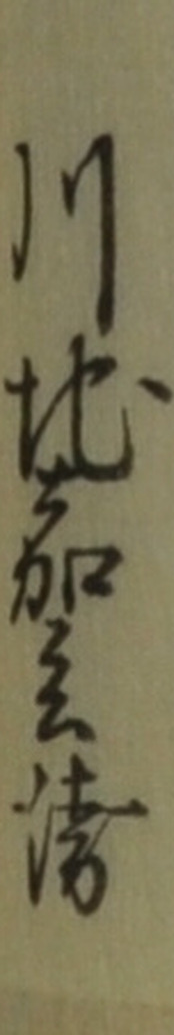川地嘉兵衛
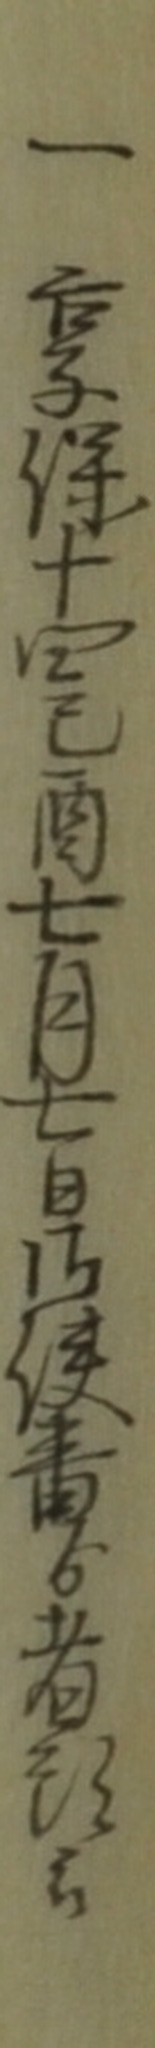一享保十四己酉七月七日御使番ゟ者頭被
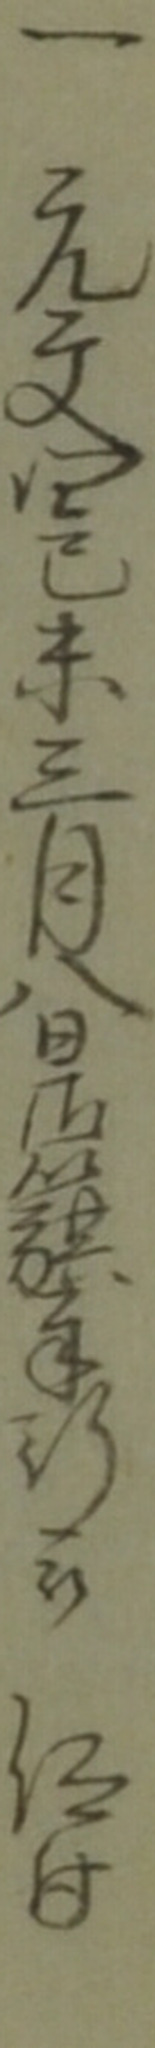一元文四己未三月八日御籏奉行被仰付
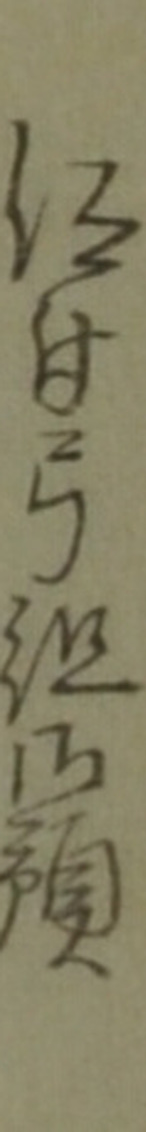仰付弓組御預
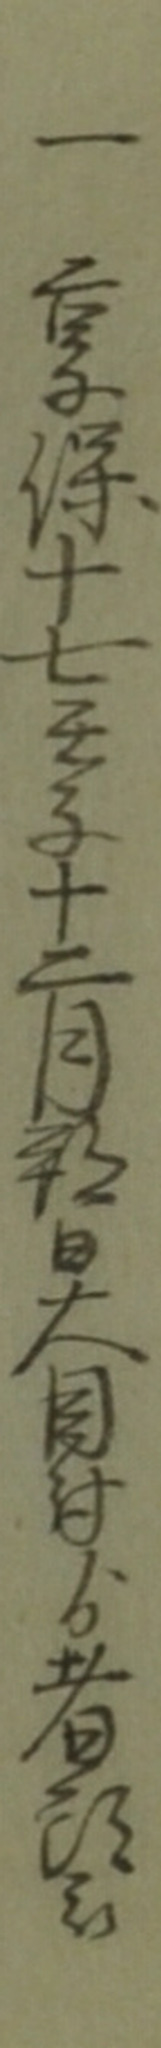一享保十七壬子十二月朔日大目付ゟ者頭被
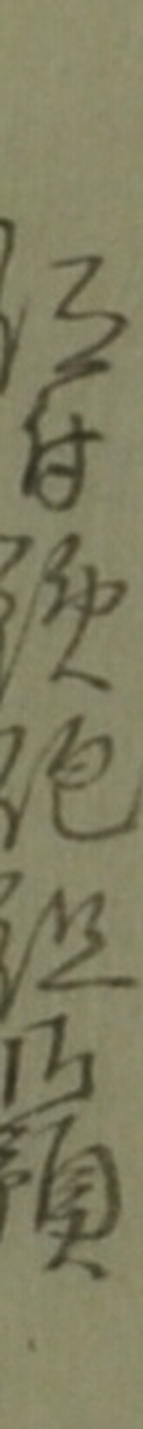仰付鉄砲組御預
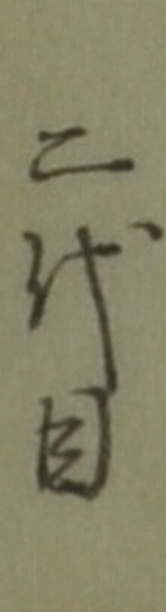二代目
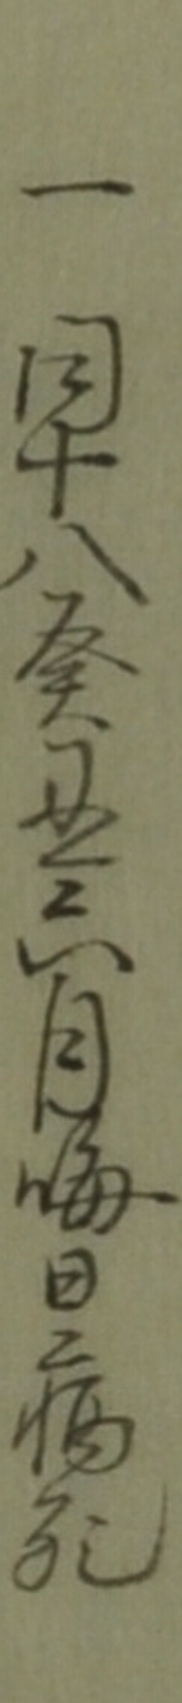一同十八癸丑六月晦日病死
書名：諸御役代々録（二）
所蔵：伊那市立高遠町図書館・合同会社AMANE
